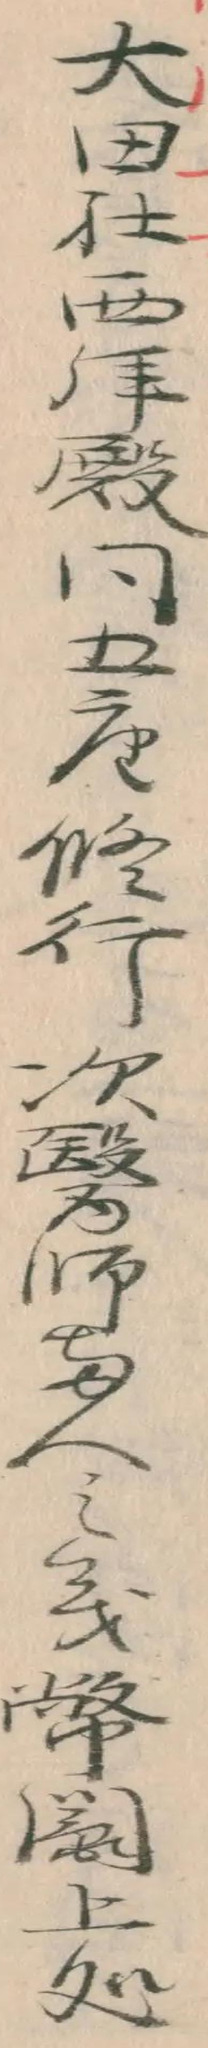大田社西拝殿同五座修行次醫師両人之義幣鬮上処
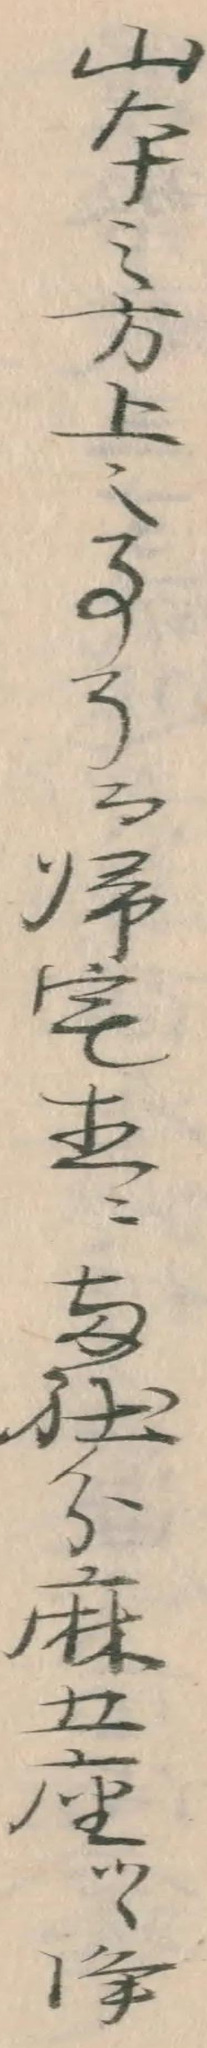山本之方上之事了而帰宅直ニ両社分麻五座ツヽ浄
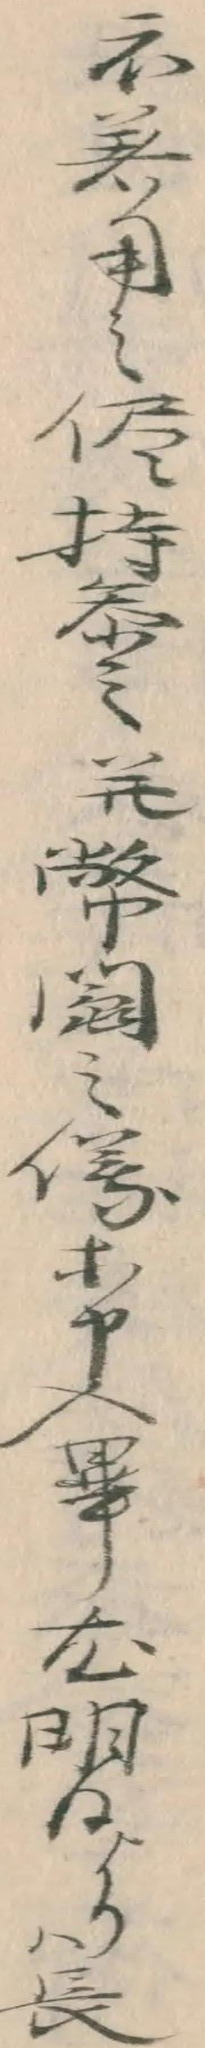不着用之侭持参之并幣鬮之儀等申入畢尤明日よりハ長
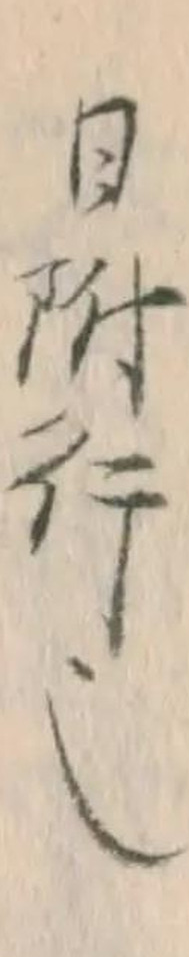日附行也
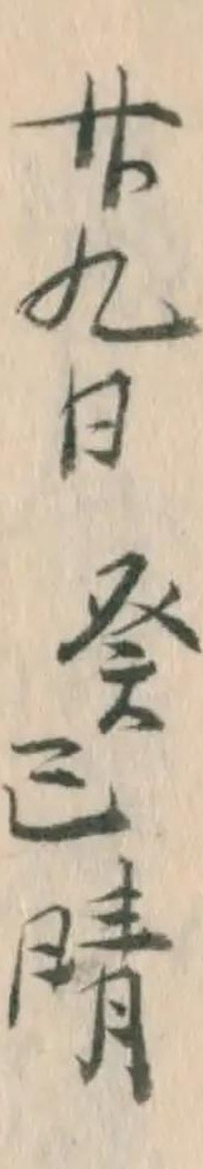廿九日癸巳晴
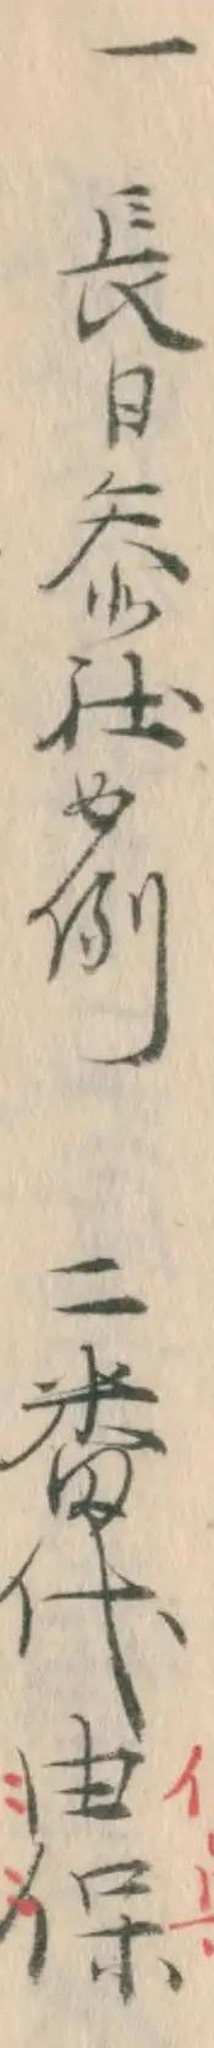一長日参社如例二番代由保
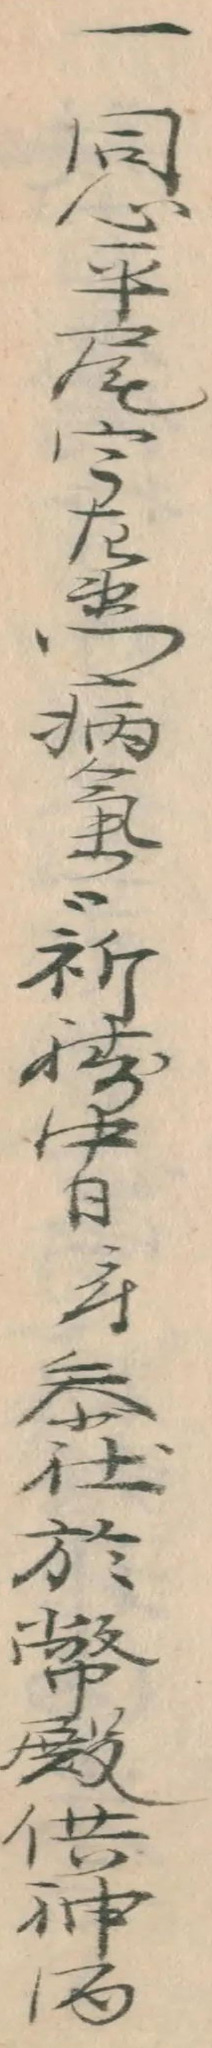一同心平尾宇左衛門病氣御祈祷中日ニ付参社於幣殿供神酒

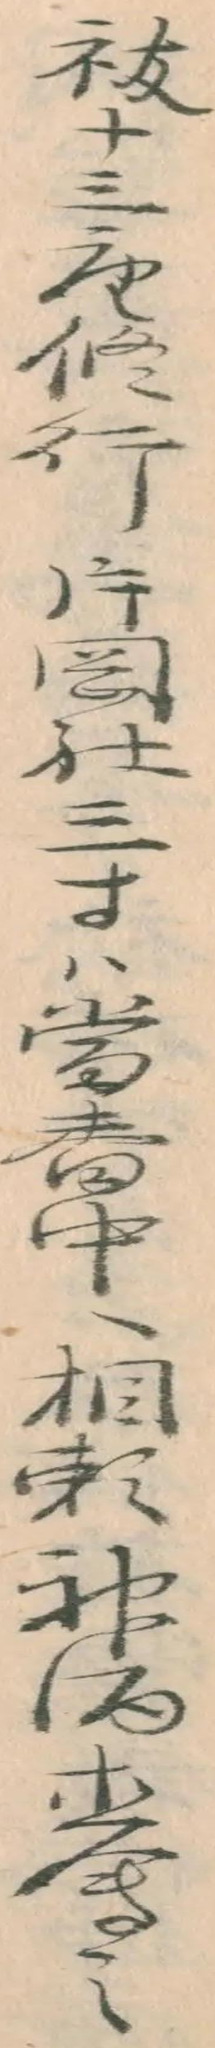祓十三座修行片岡社三寸ハ當番中へ相頼神酒直會之
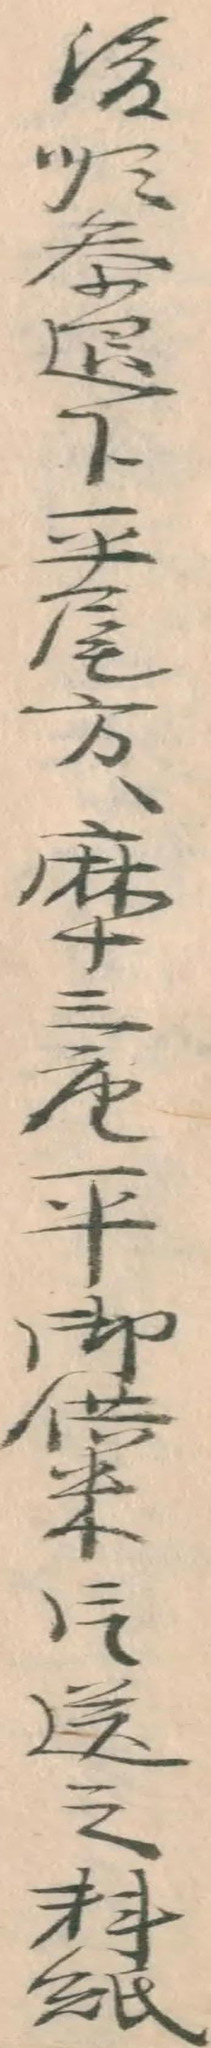後順参退下平尾方へ麻十三座平御供米片送之料紙
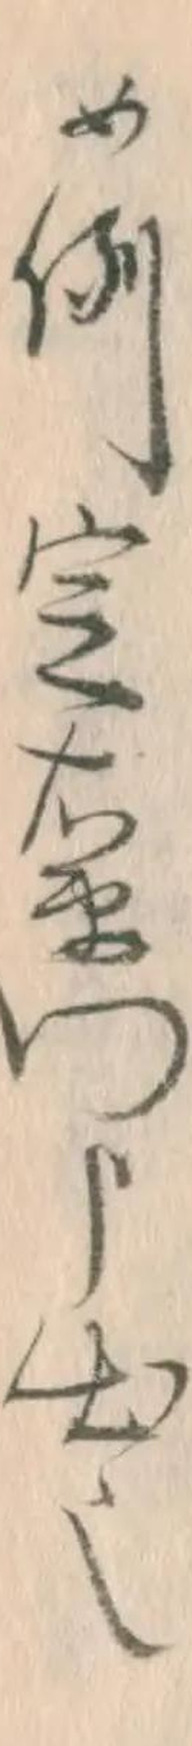如例定右衛門申出也
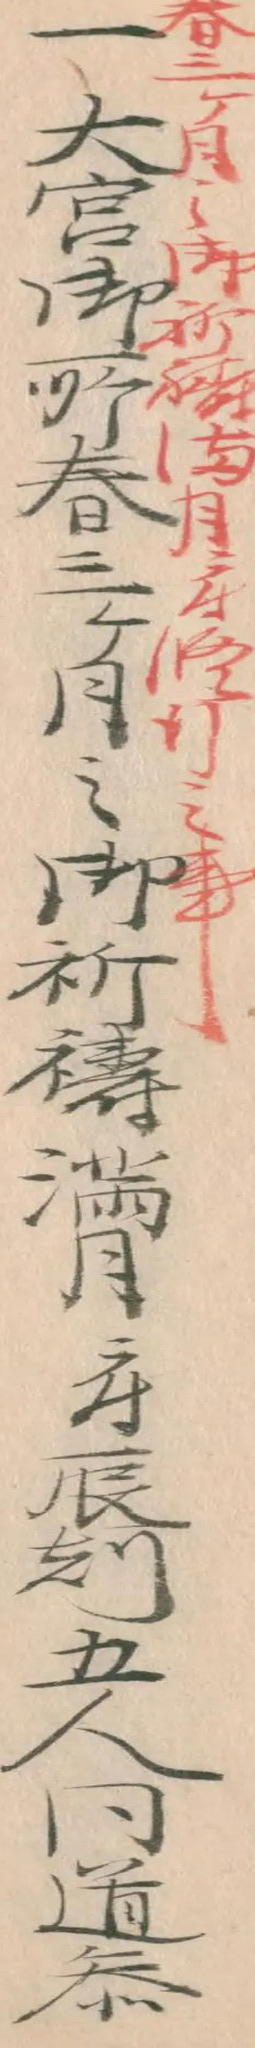一大宮御所春三ケ月之御祈祷満月ニ付辰刻五人同道参
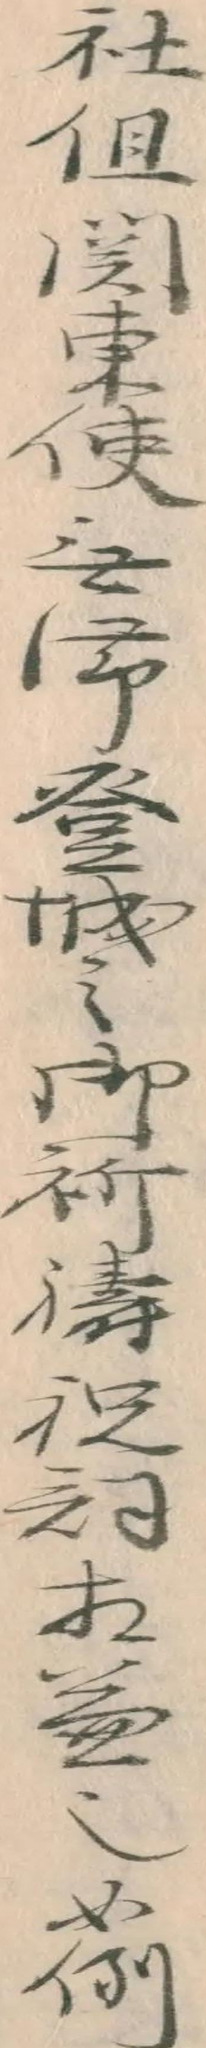社但関東使無滞登城之御祈祷祝詞相兼也如例
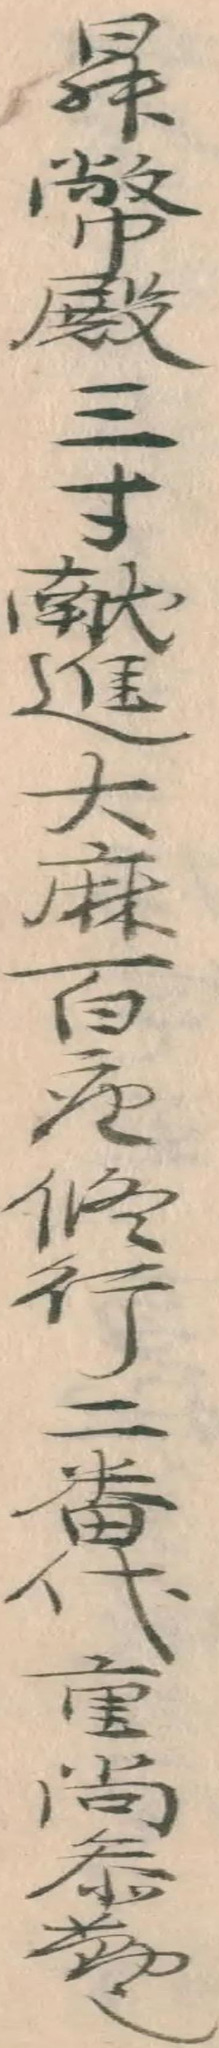昇幣殿三寸献進大麻百座修行二番代重尚参勤也
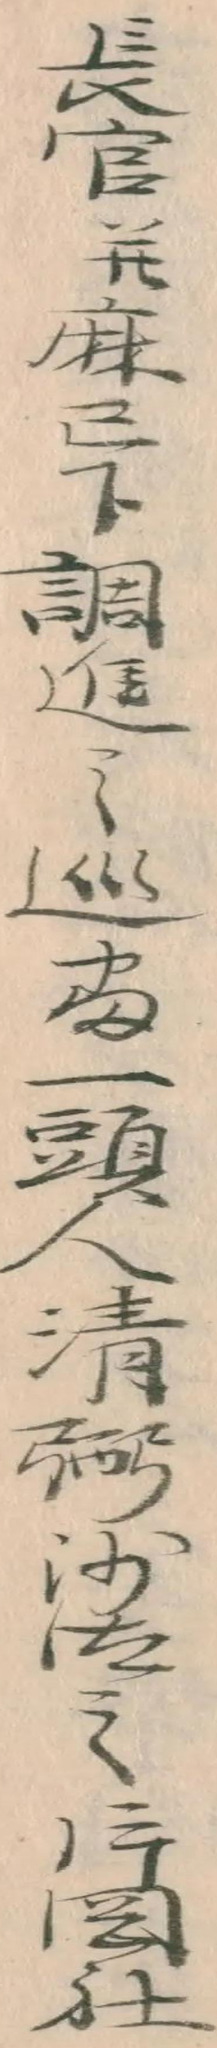長官并麻已下調進之巡番一頭人清弼沙汰之片岡社
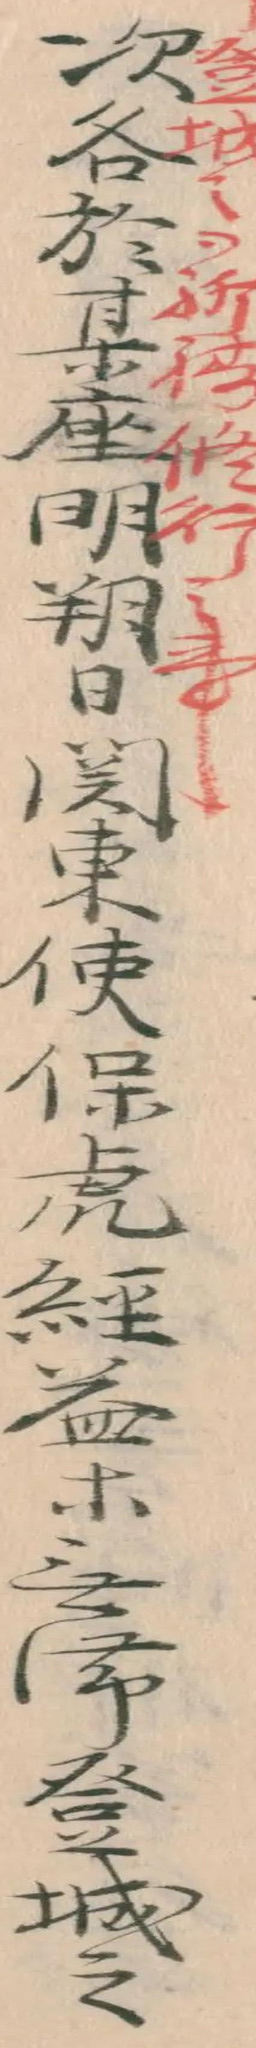次各於某座明朔日関東使保虎経益等無滞登城之
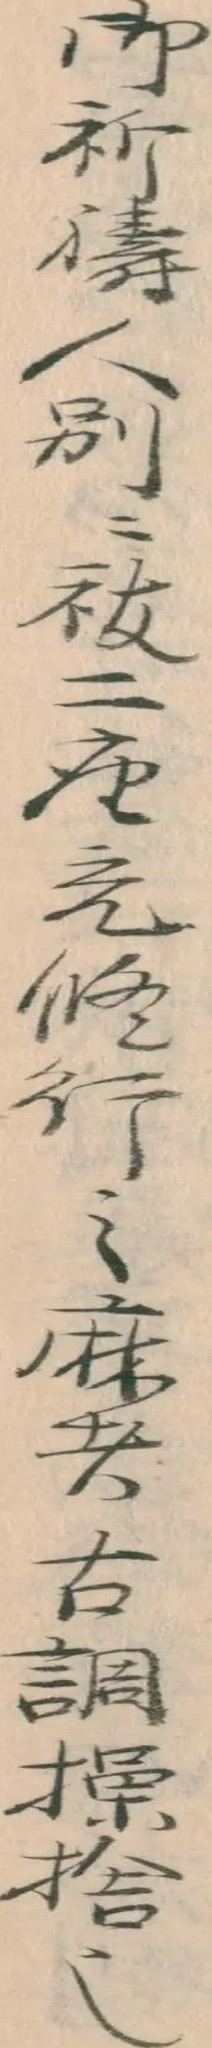御祈祷人別ニ祓二座充修行之麻者古調操捨也
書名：賀茂社記録. 第73冊
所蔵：国立国会図書館 National Diet Library, JAPAN
